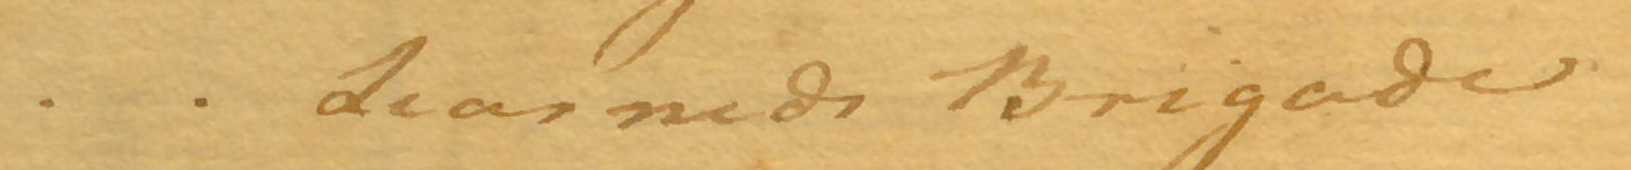.. Learneds Brigade
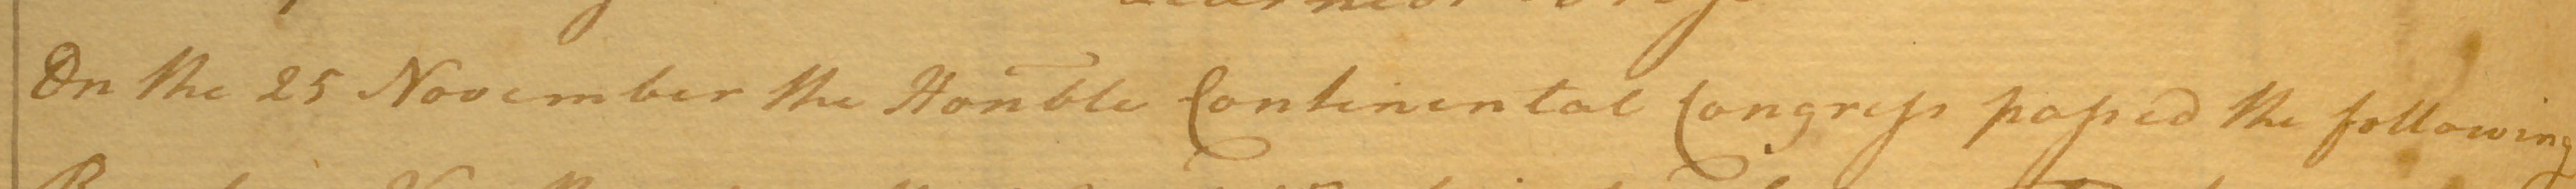On the 25 November the Honble Continental Congress passed the following
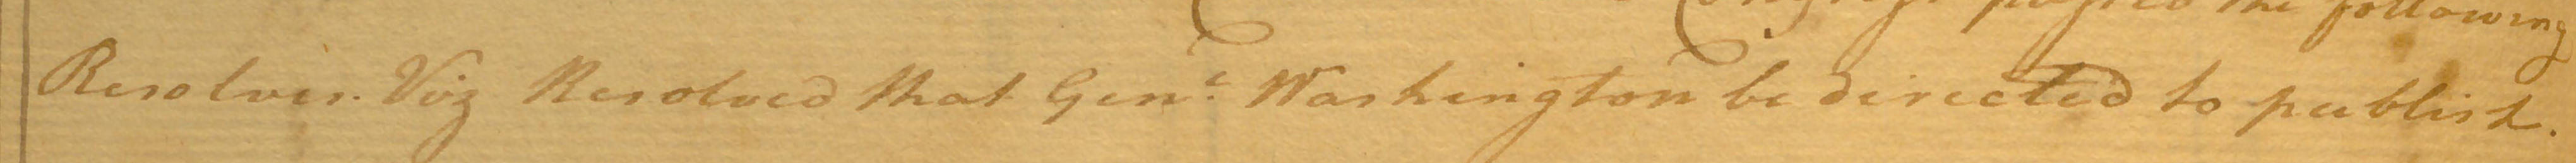Resolves Viz. Resolved that Gen^l. Washington be directed to publish
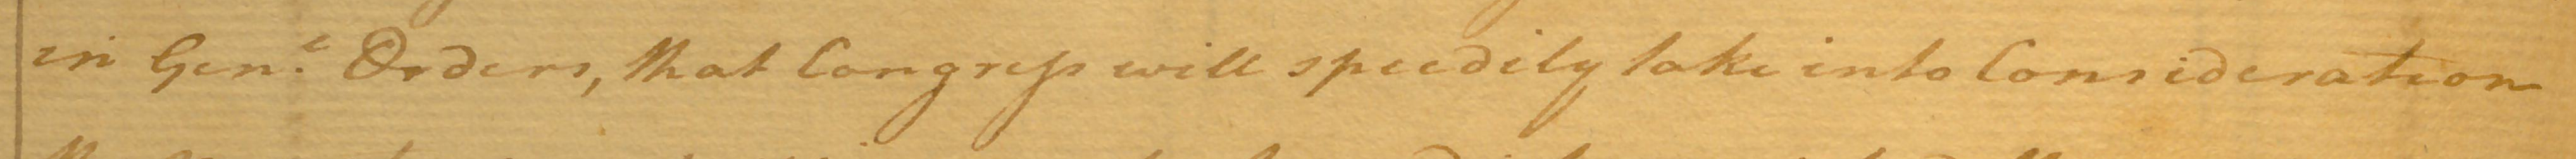in Gen^l. Orders, that Congress will speedily take into Consideration
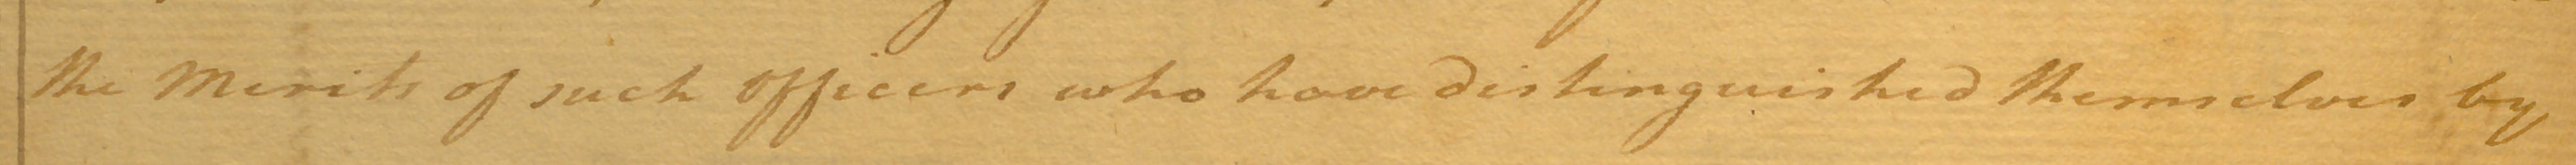the Merits of such officers who have distinguished themselves by
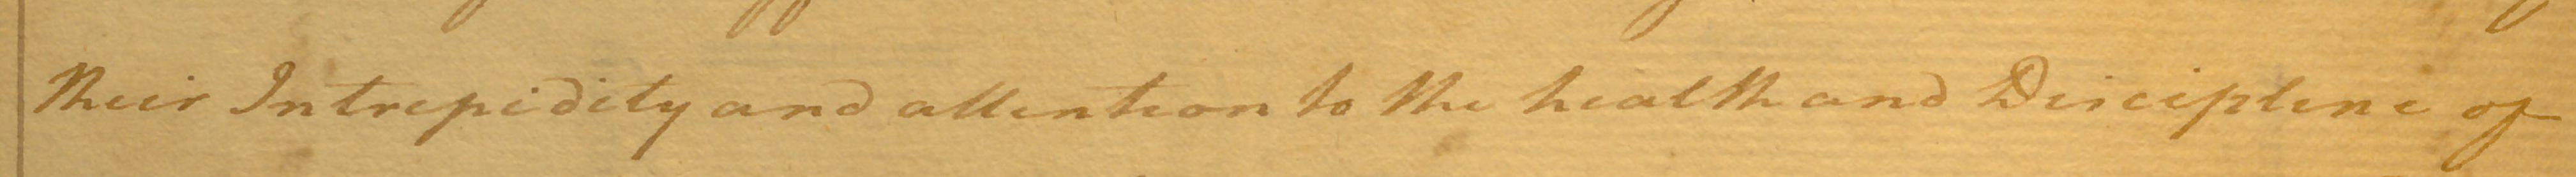their Intrepidity and attention to the health and Discipline of
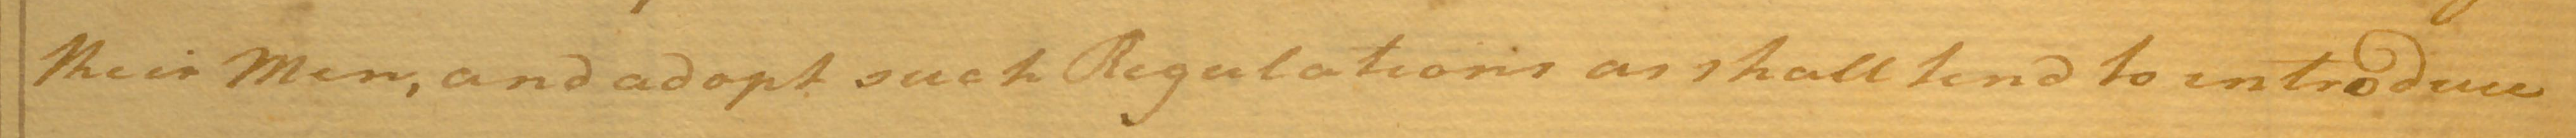their Men, and adopt such Regulations as shall tend to introduce
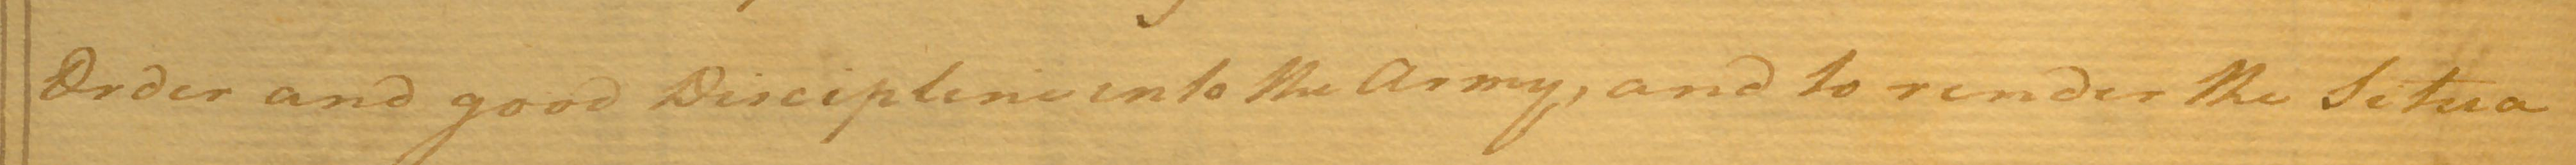Order and good Discipline into the Army, and to render the Situa
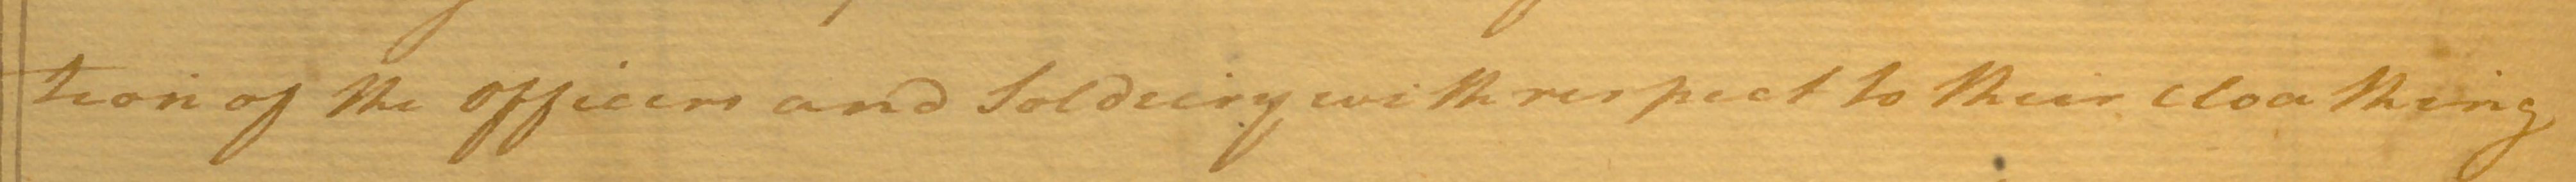tion of the Officers and Soldiery with the respect to their cloathing
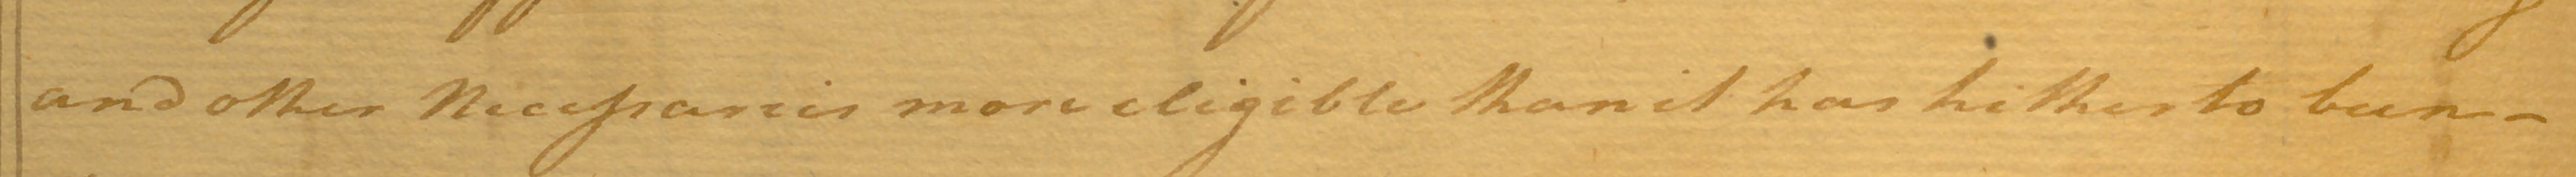and other Necessaries more eligible than it has hither to been-
